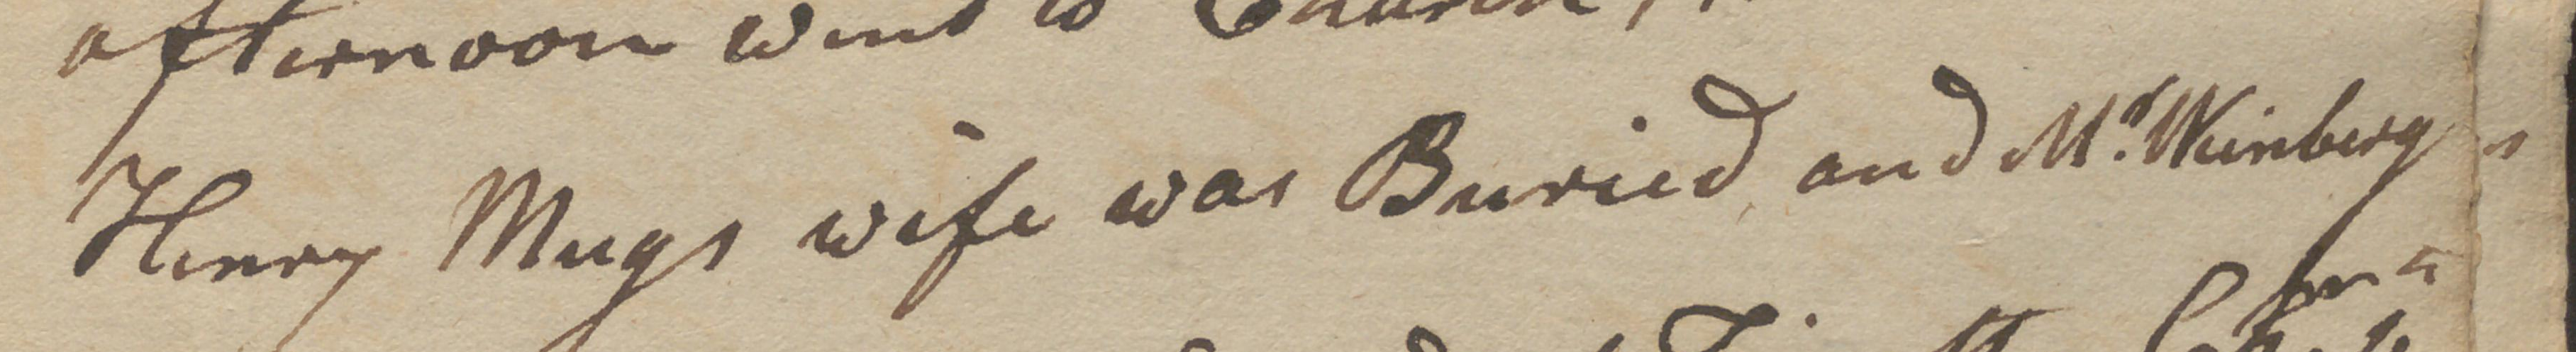Henry Mugs wife was Buried and M^r. Weinberg
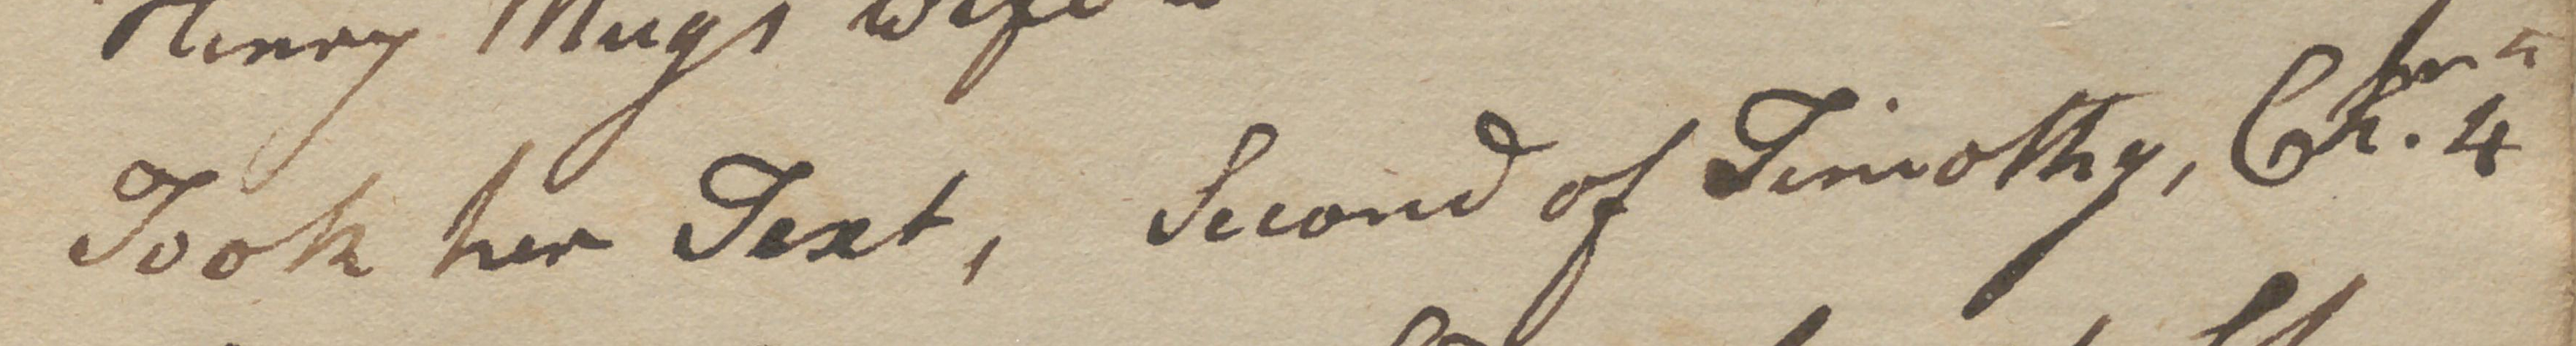Took her Text, Second of Timothy, Ch^r. 4
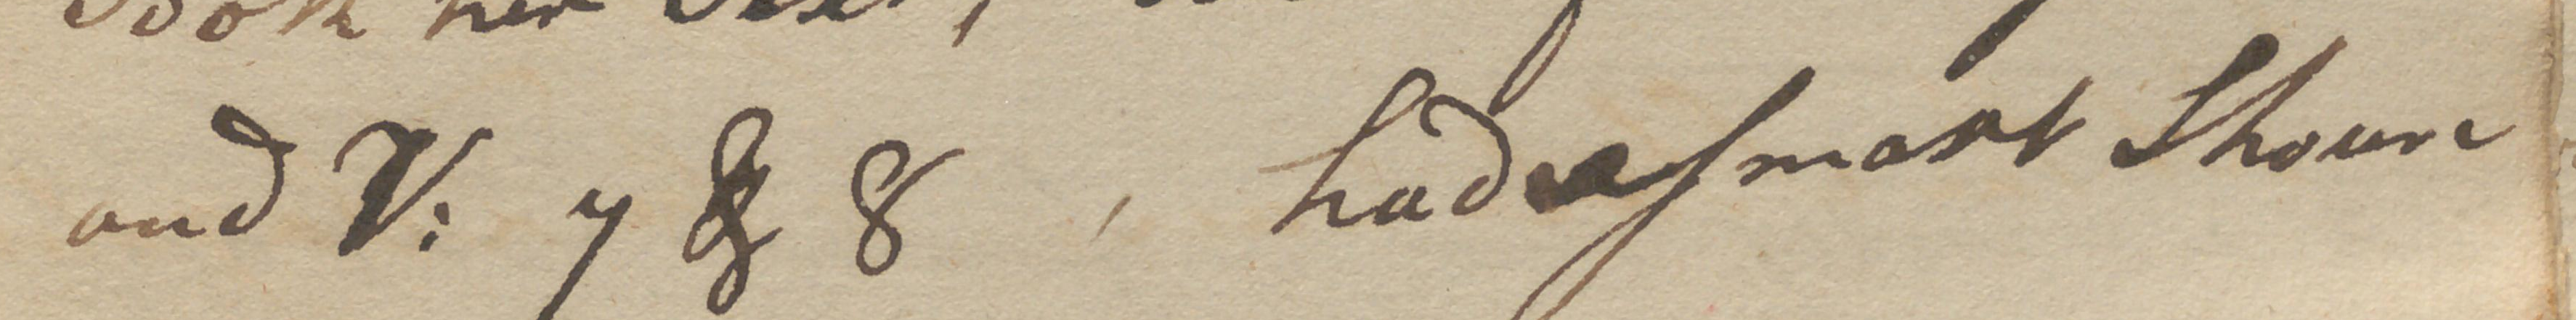and V: 7 & 8, had a smart Shoure
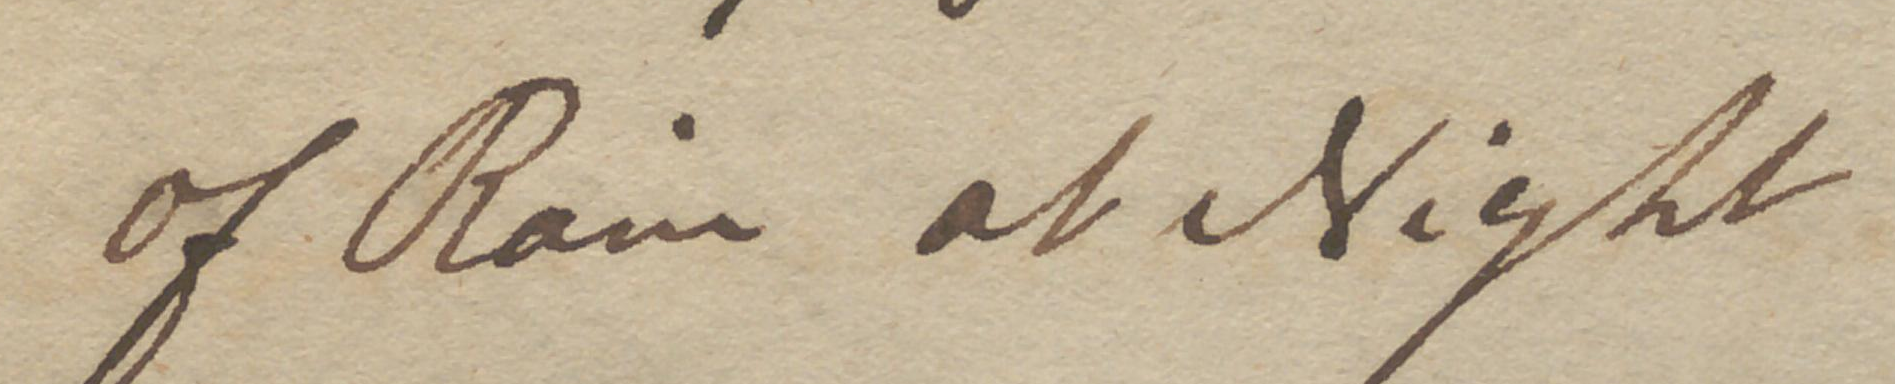of Rain at Night
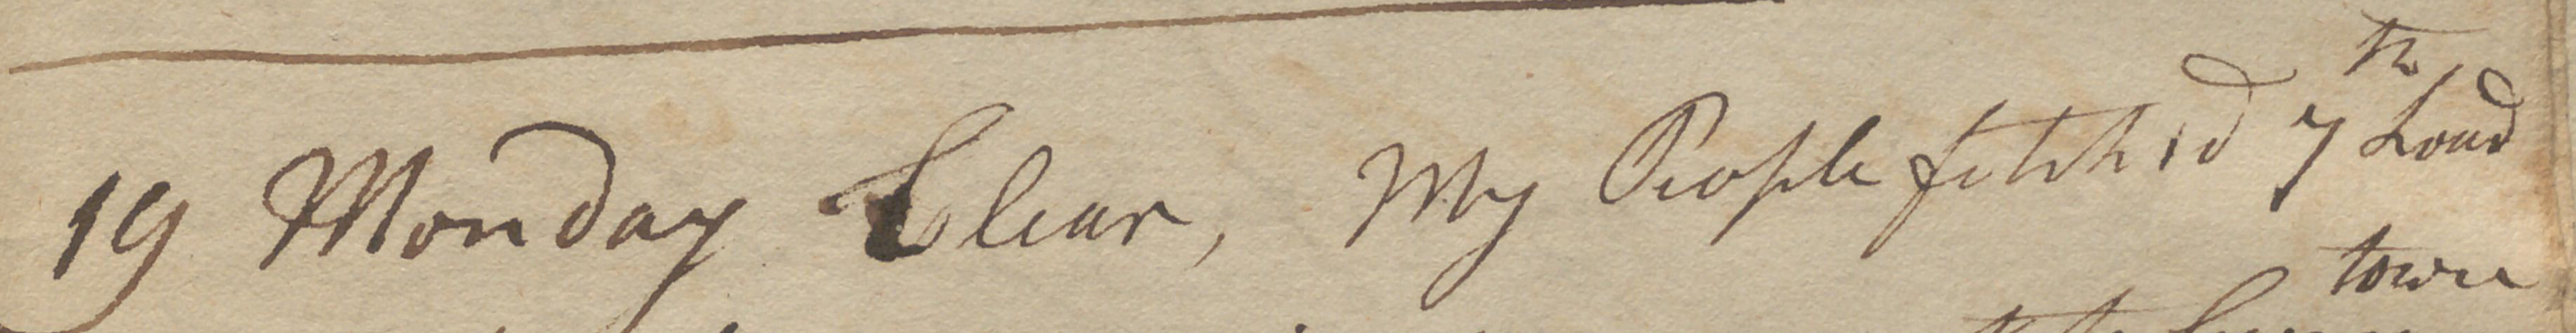19 Monday Clear, My People fetch'd 7^th Load
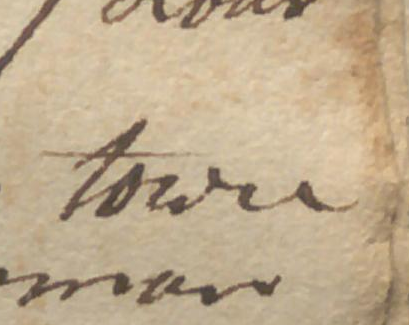town
